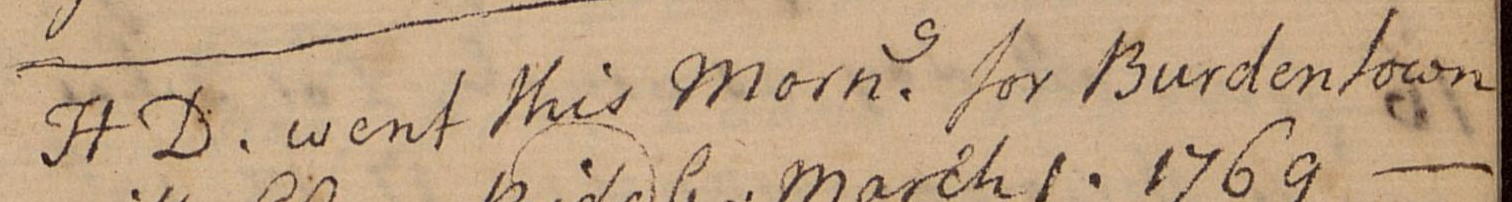H D. went this morn^g. for Burdentown
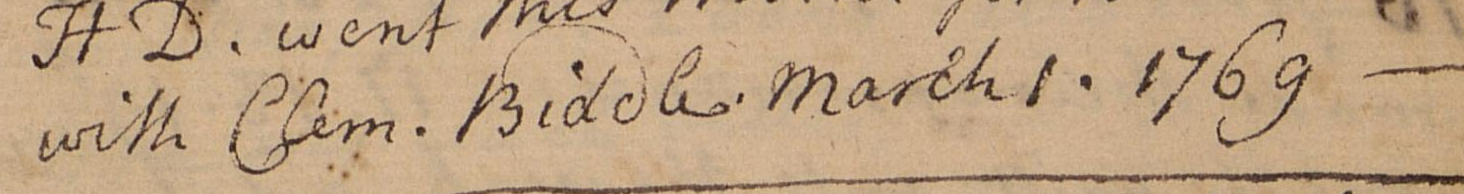with Clem. Biddle. March1. 1769-
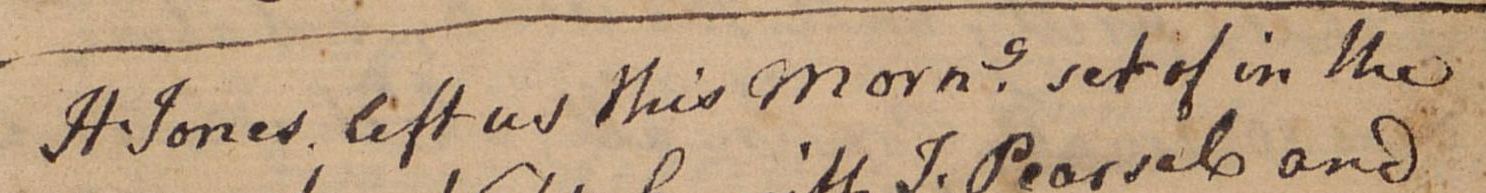H. Jones left us this morn^g. set of in the
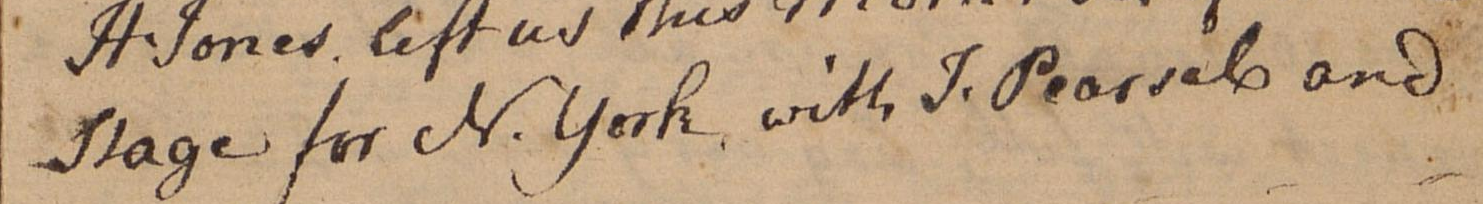Stage for N. York with J. Pearsels and
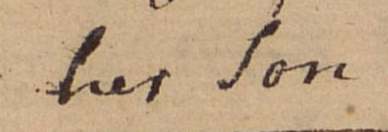her Son
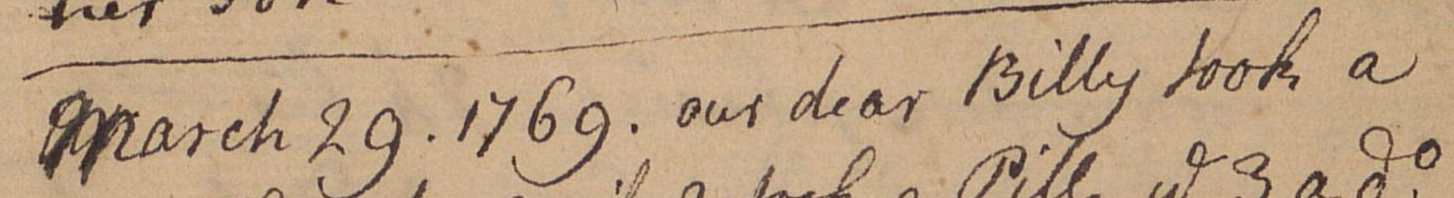March 29. 1769. our dear Billy took a
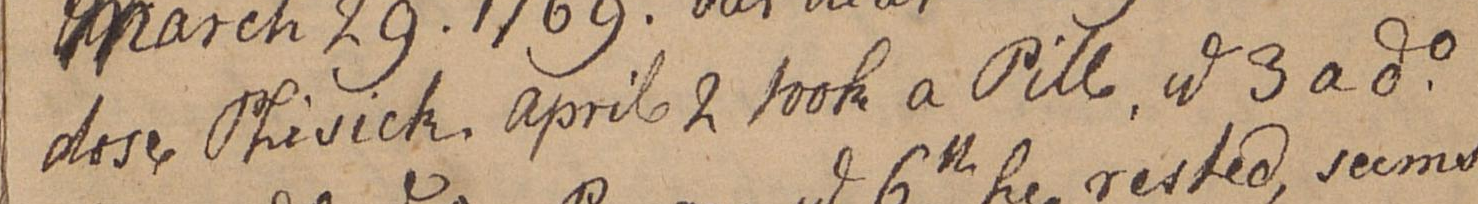dose Phisick, April 2 took a Pill, y^e 3 a d^o.
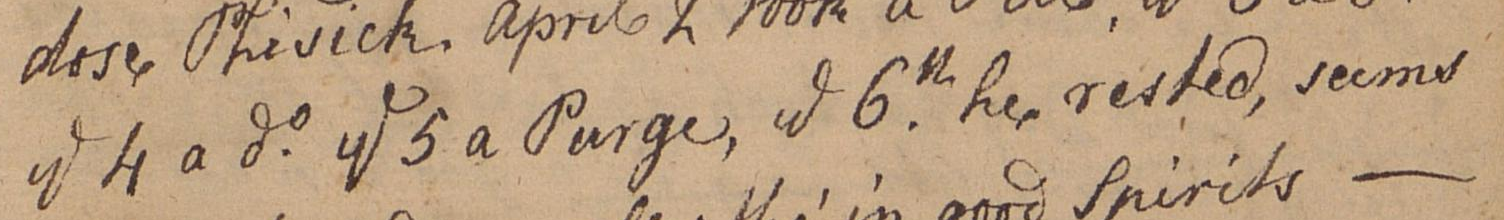y^e 4 a d^o. y^e 5 a Purge, y^e 6^th he rested, seems
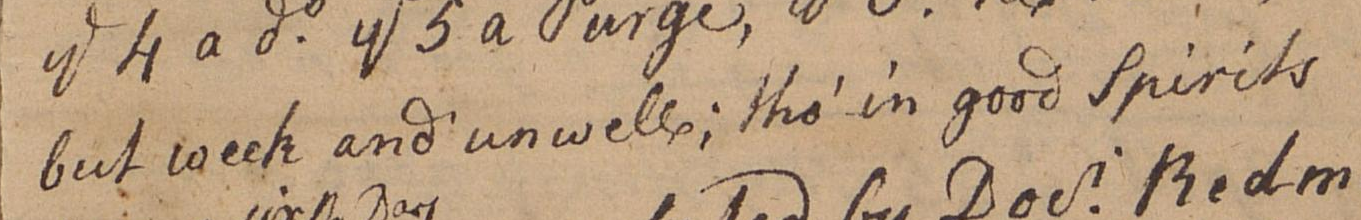but week and unwell; tho' in good Spirits-
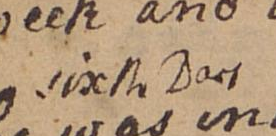sixth Day
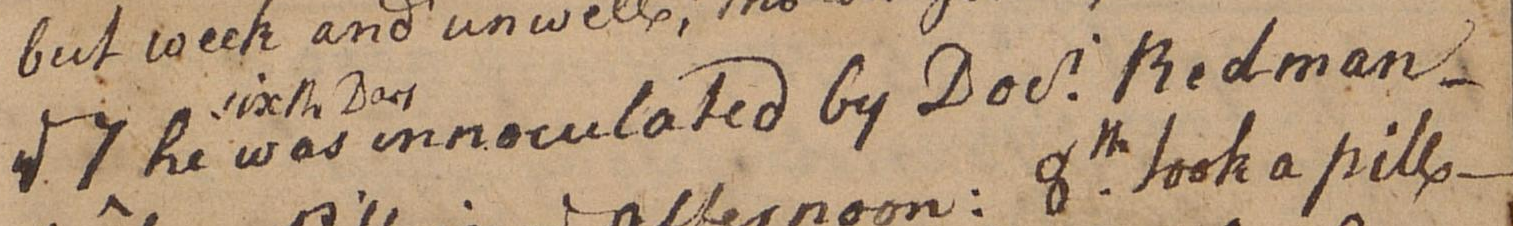y^e 7 ^ he was innoculated by Doc^r. Redman-
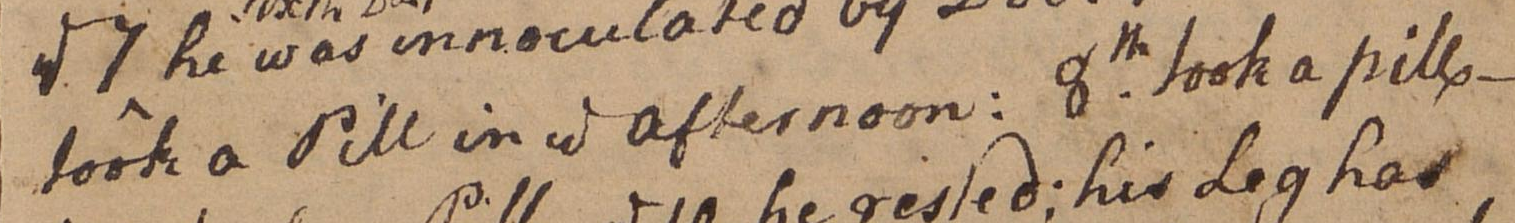took a Pill in y^e afternoon: 8^th. took a pill-
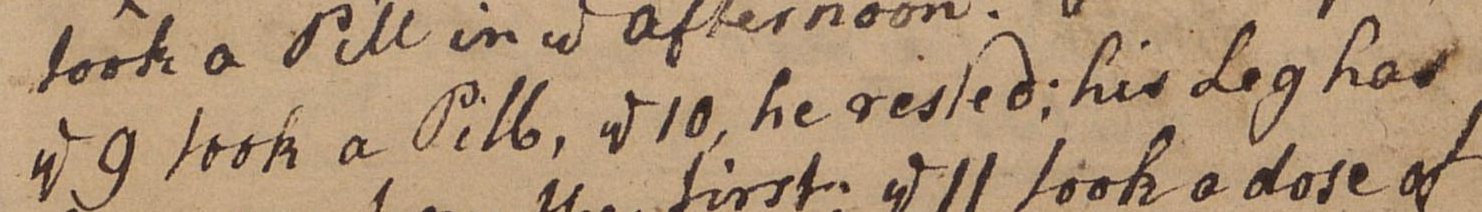y^e 9 took a Pill, y^e 10, he rested; his Leg has
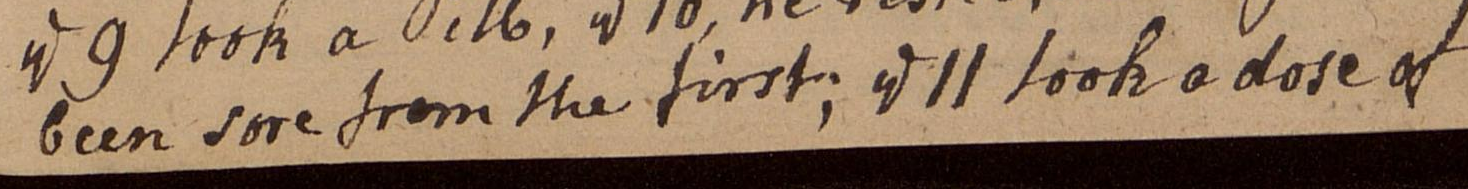been sore from the first; y^e 11 took a dose of
